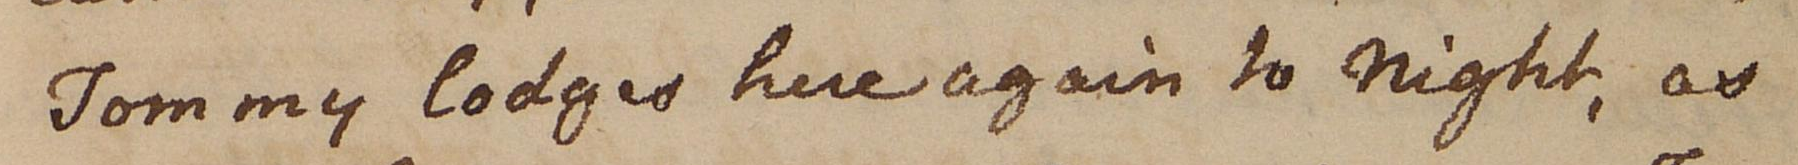Tommy lodges here again to night, as
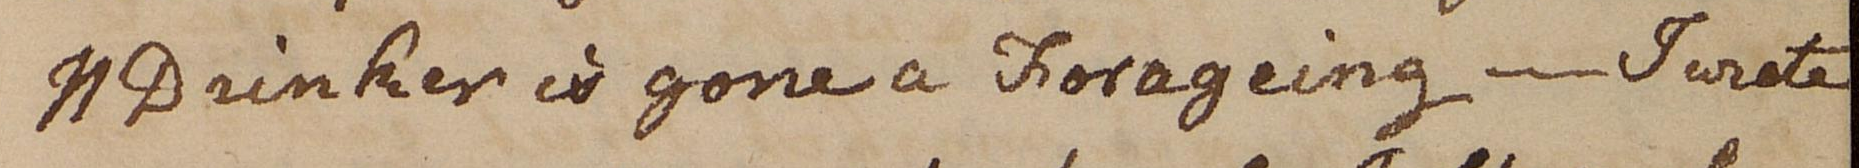H Drinker is gone a Foraging- I wrote
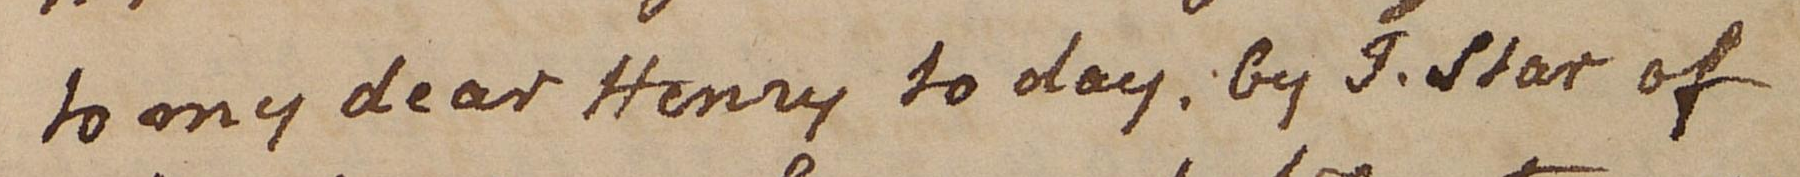to my dear Henry to day, by J. Star of
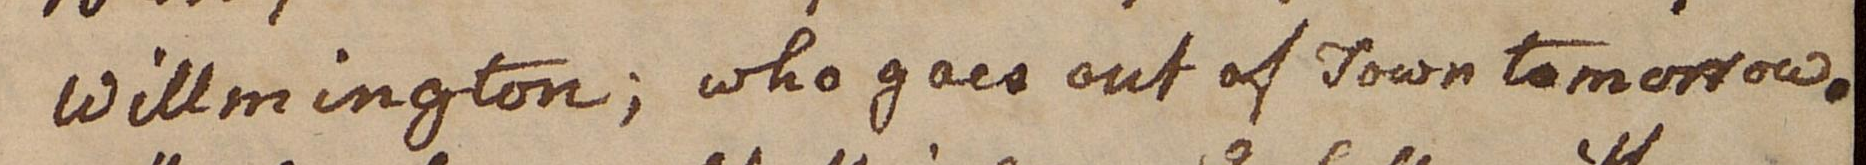Willmington; who goes out of Town tomorrow.
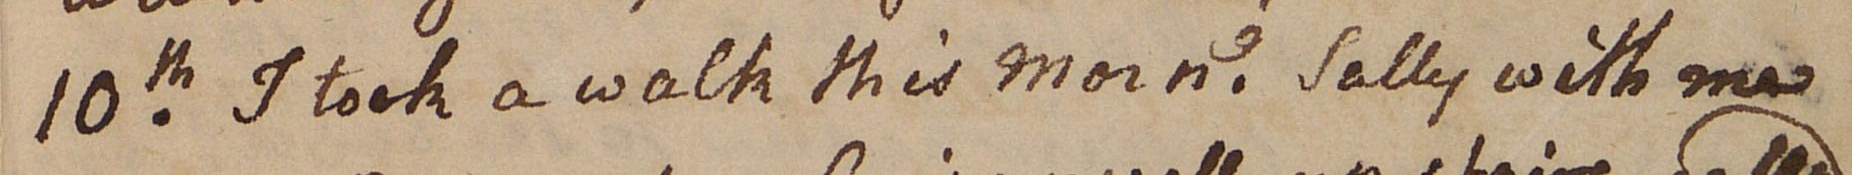10^th. I took a walk this Morn^g. Sally with me
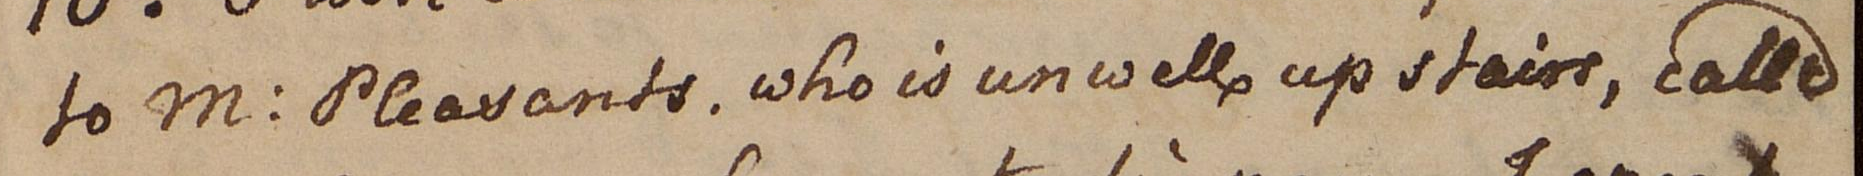to M: Pleasants. who is unwell up stairs, calld
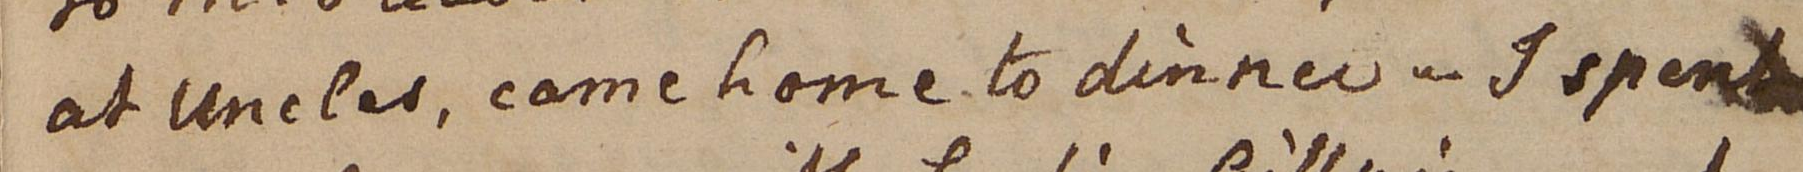at Uncles, came home to dinner- I spent
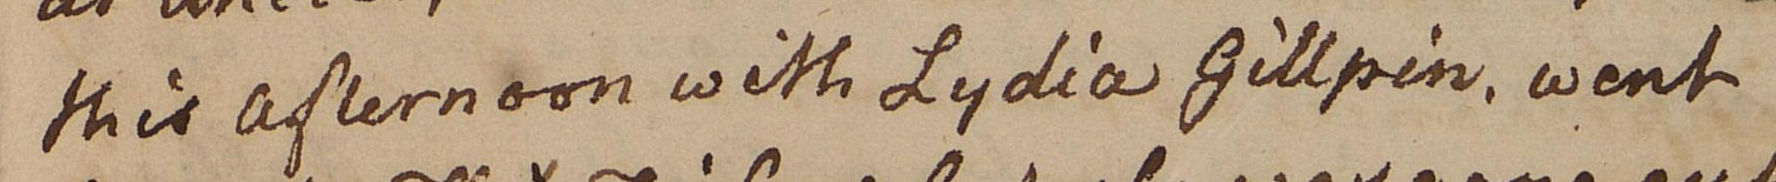this afternoon with Lydia Gillpin, went
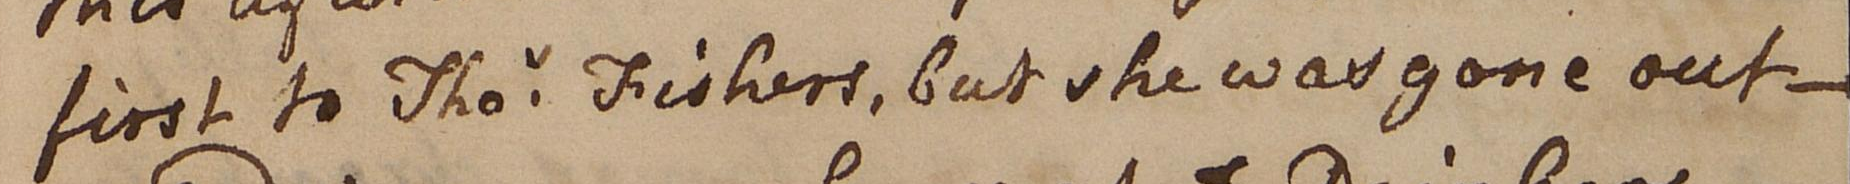first to Tho^s. Fishers, but she was gone out-
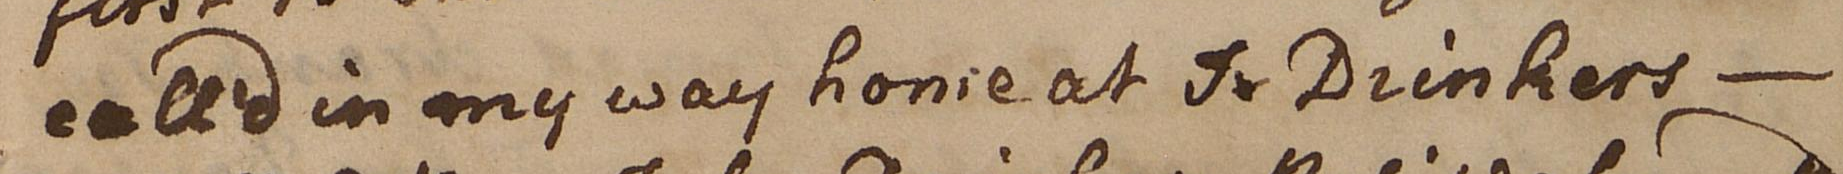call'd in my way home at I. Drinkers-
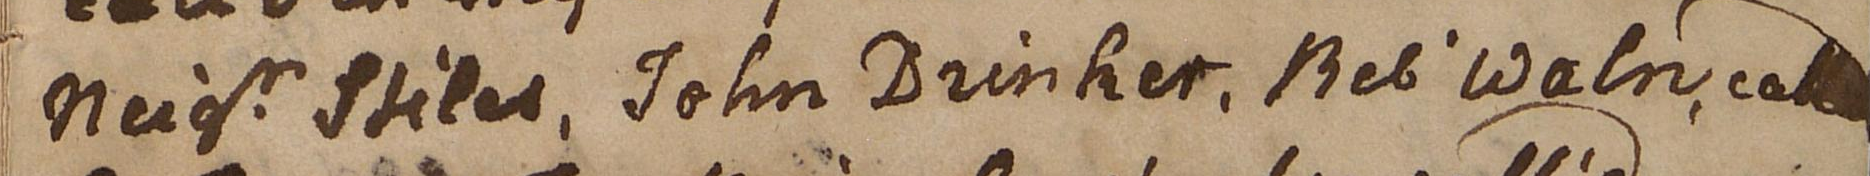Neig^r. Stiles, John Drinker, Reb' Waln, cal[ld]
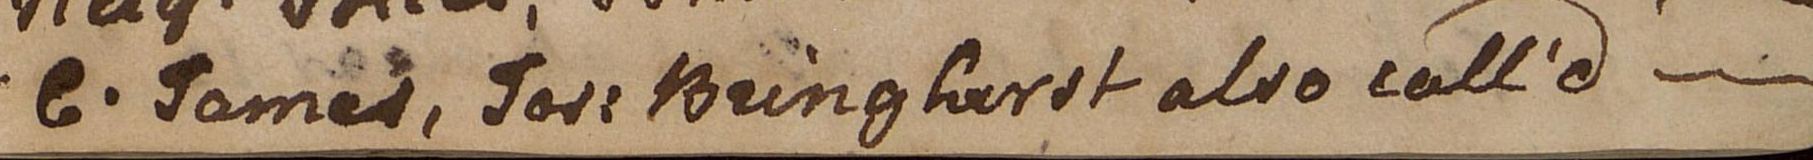C. James, Jos: Bringhurst also call'd-
